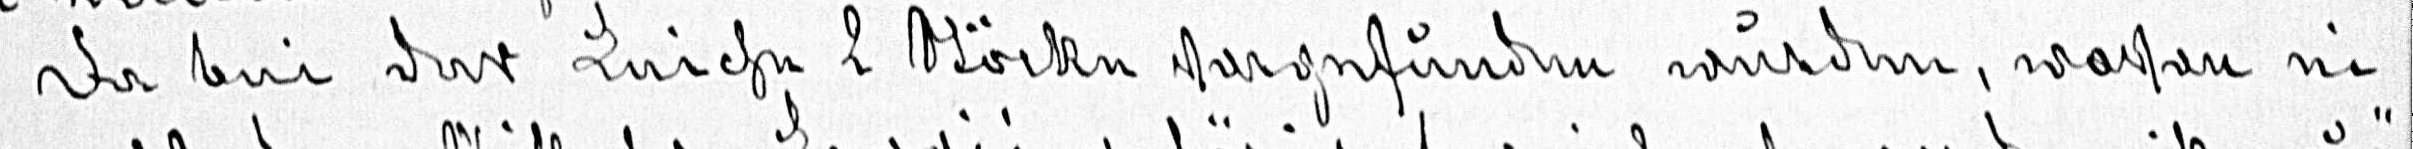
Da bei der Leiche 2 Stöcke vorgefunden wurden, wovon ei¬
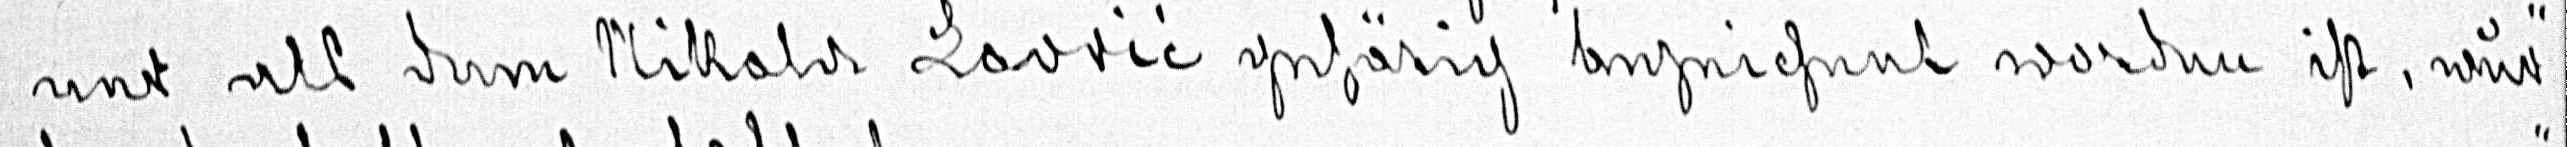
ner als dem Nikola Lovrić gehörig bezeichnet worden ist, wur¬
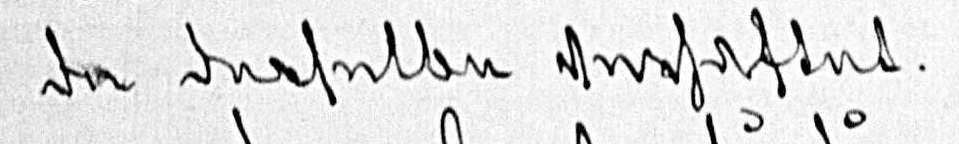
de derselbe verhaftet.
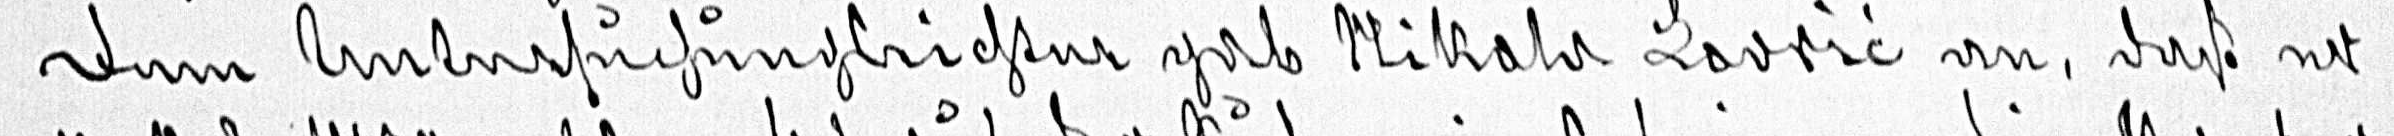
Dem Untersuchungsrichter gab Nikola Lovrić an, daß er
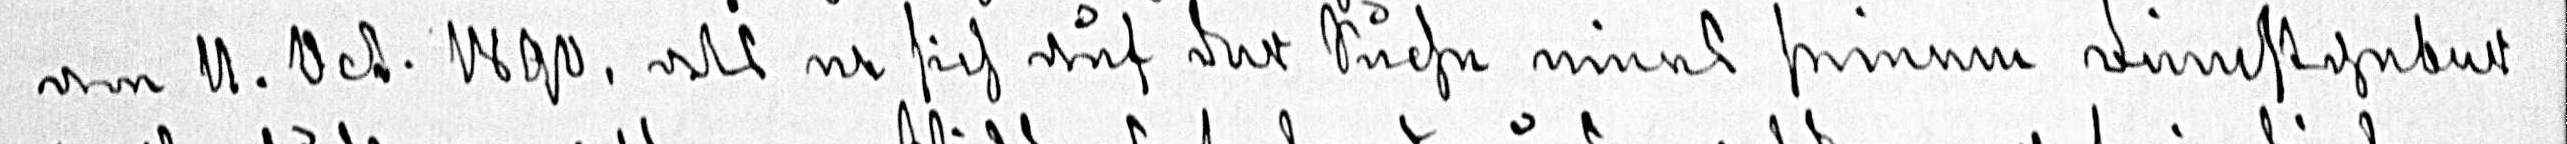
am 11. Oct. 1890, als er sich auf der Suche eines seinem Dienstgeber
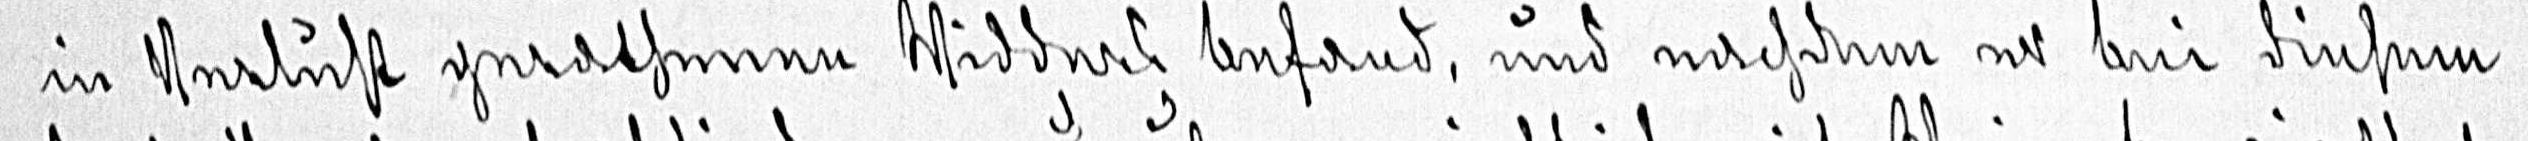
in Verlust gerathenen Widders befand, und nachdem er bei diesem
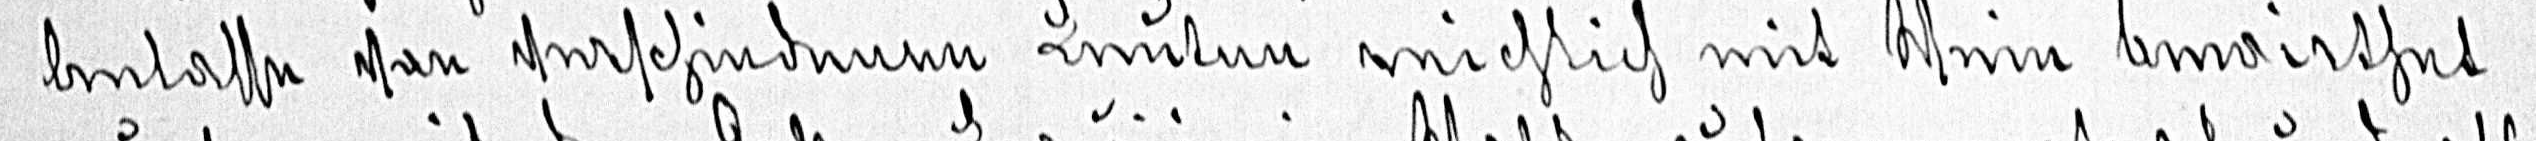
Anlasse von verschiedenen Leuten reichlich mit Wein bewirthet
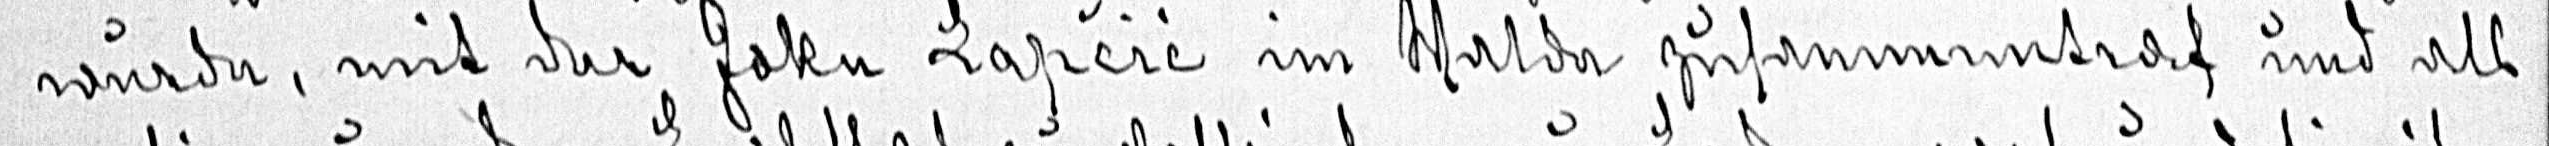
wurde, mit der Joka Lapčić im Walde zusammentraf und als
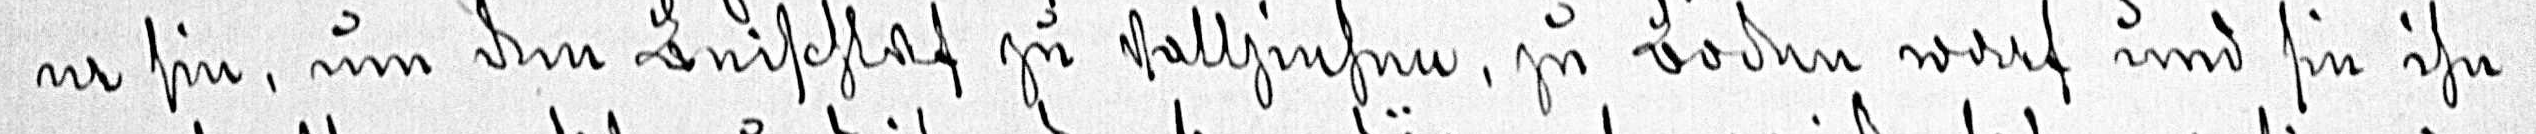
er hin, um den Beischlaf zu vollziehen, zu Boden warf und sie ihn
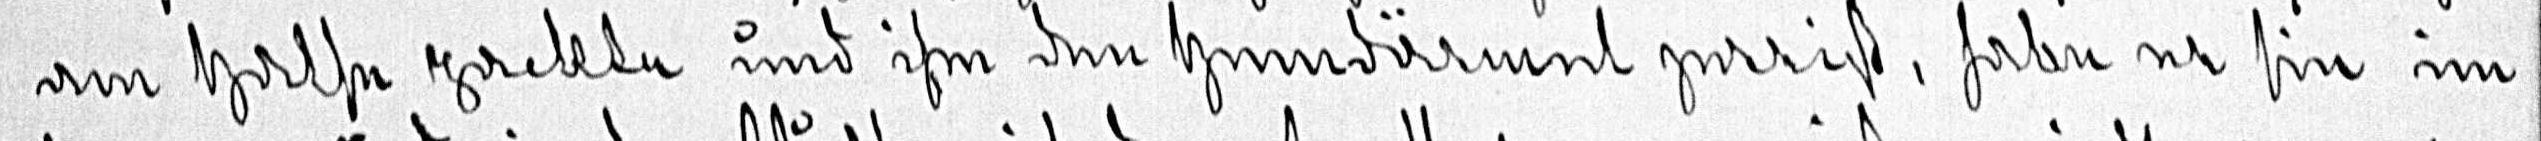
am Halse packte und ihm den Hemdärmel zerriß, habe er sie im
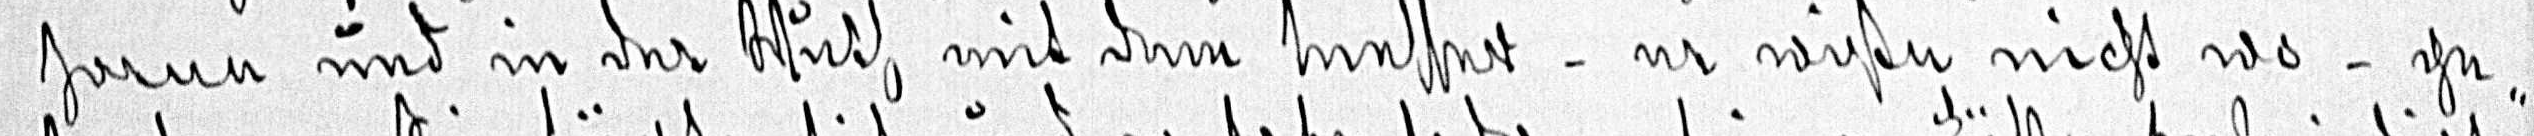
Zorne und in der Wuth mit dem Messer – er wiße nicht wo – ge¬
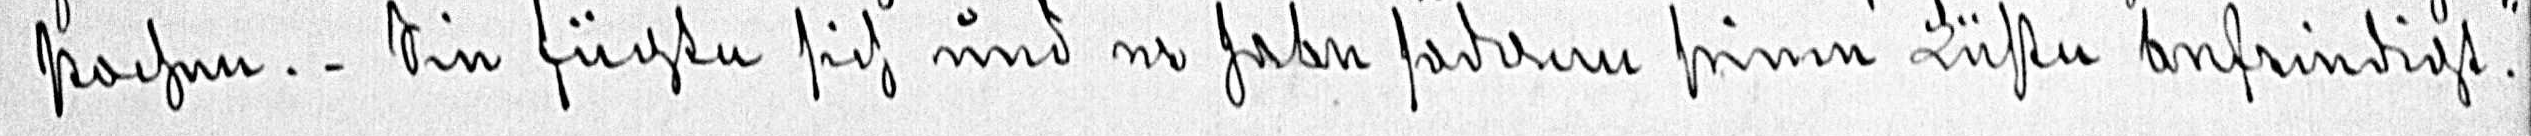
stochen. – Sie fügte sich und er habe sodann seine Lüste befriedigt.
